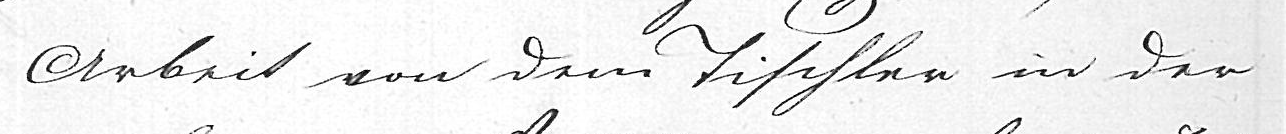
Arbeit von dem Tischler in der
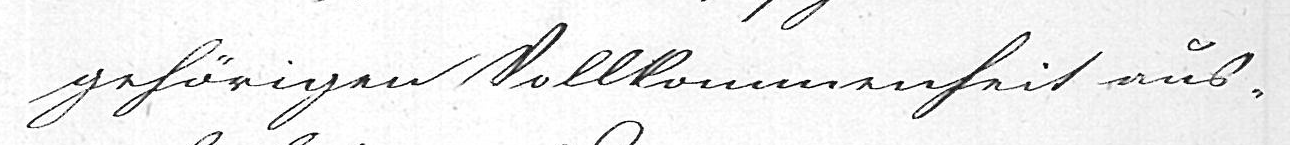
gehörigen Vollkommenheit aus-
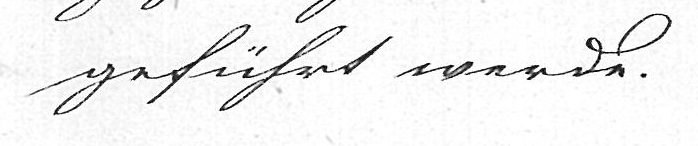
geführt werde
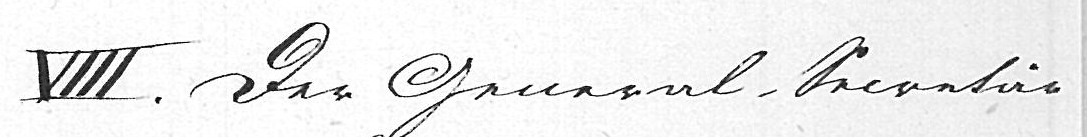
VIII. Der General-Secretär
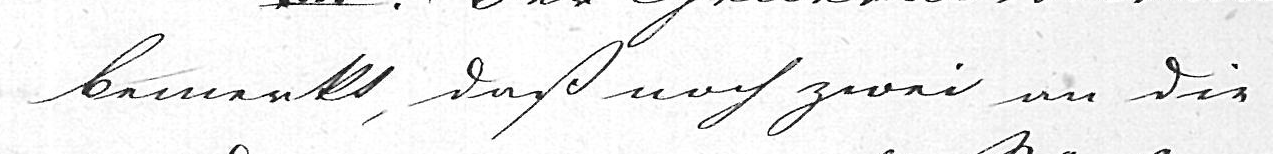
bemerkt, daß noch zwei an die
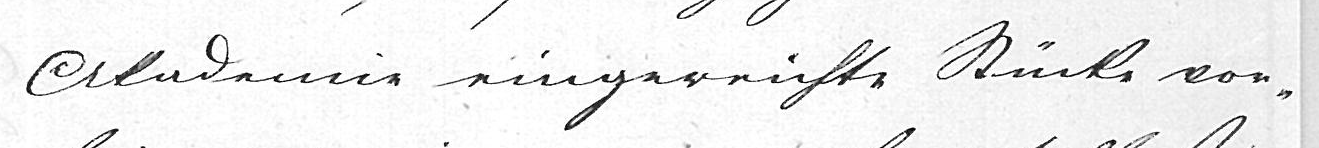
Akademie eingerichte Stücke vor-
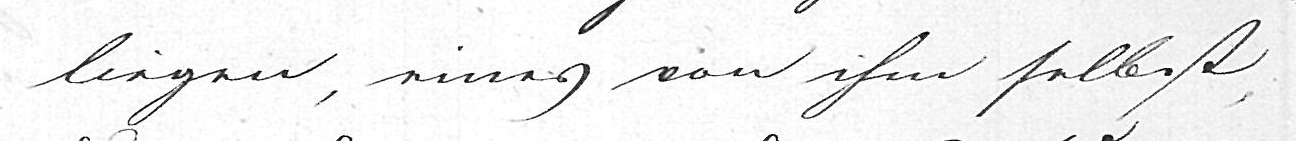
liegen, eines von ihm selbst
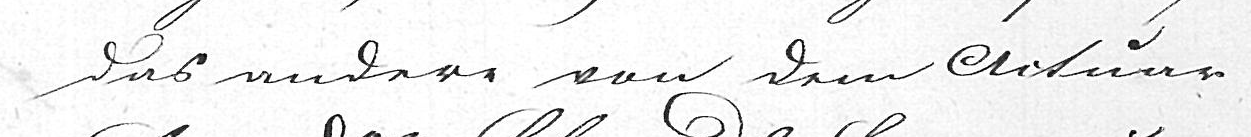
das andere von dem Actuar
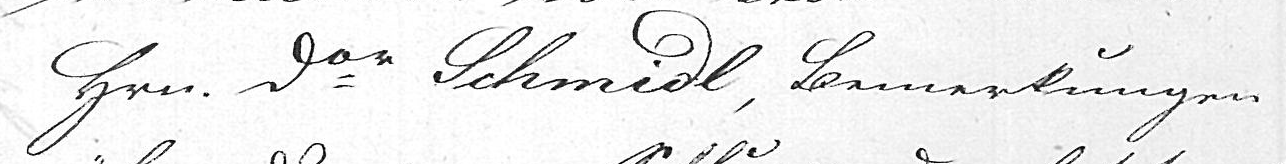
Hrn Dor Schmidl, Bemerkungen
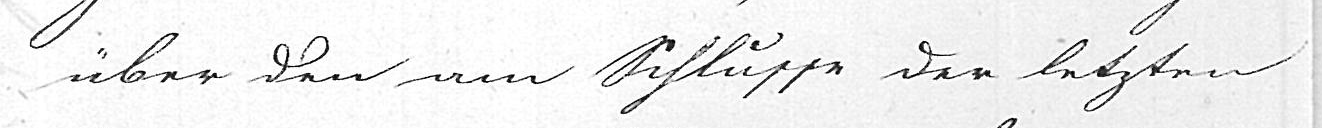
über den am Schlusse der letzten
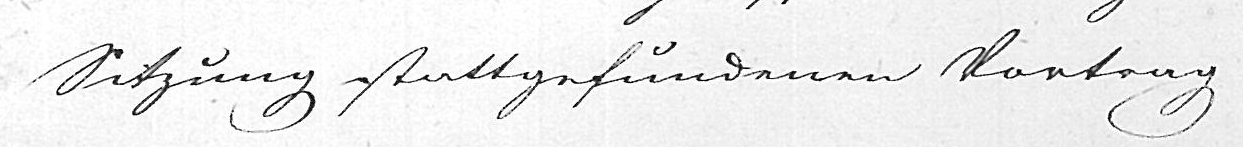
Sitzung stattgefundenen Vortrag
